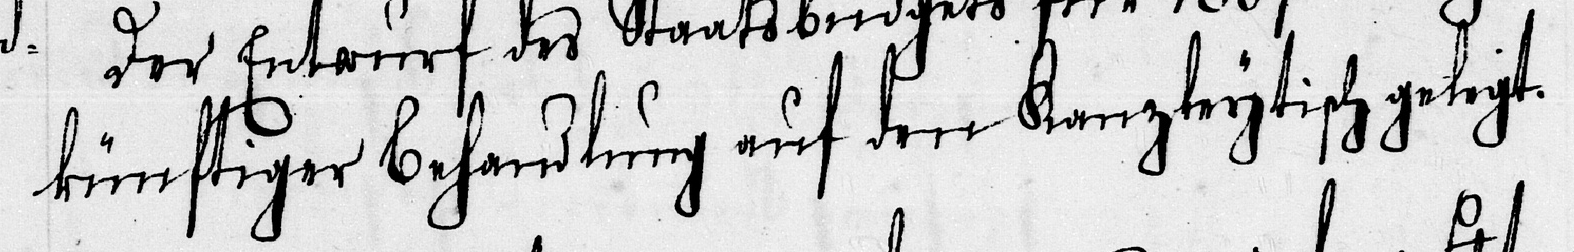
künftiger Behandlung auf den Kanzleytisch gelegt.
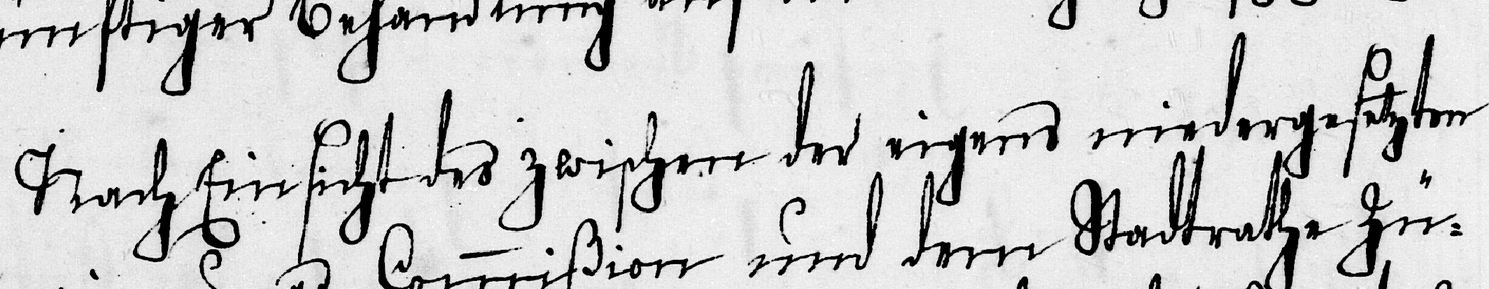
Nach Einsicht des zwischen der eigens niedergesetzten
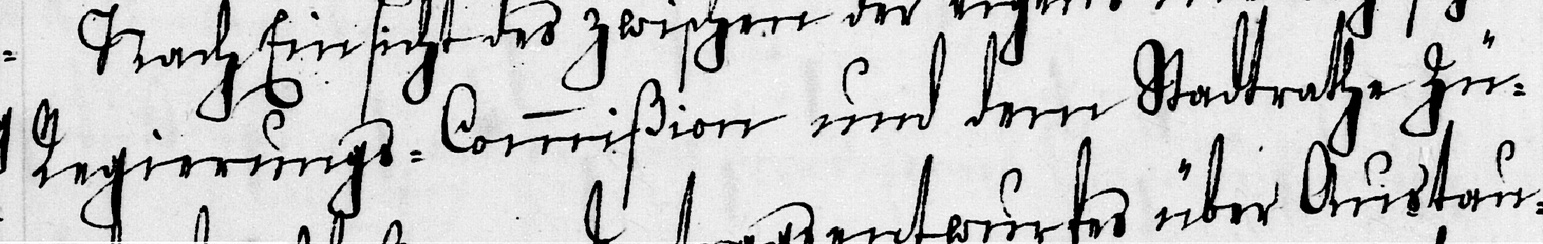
Regierungs-Commißion und dem Stadtrathe Zü¬
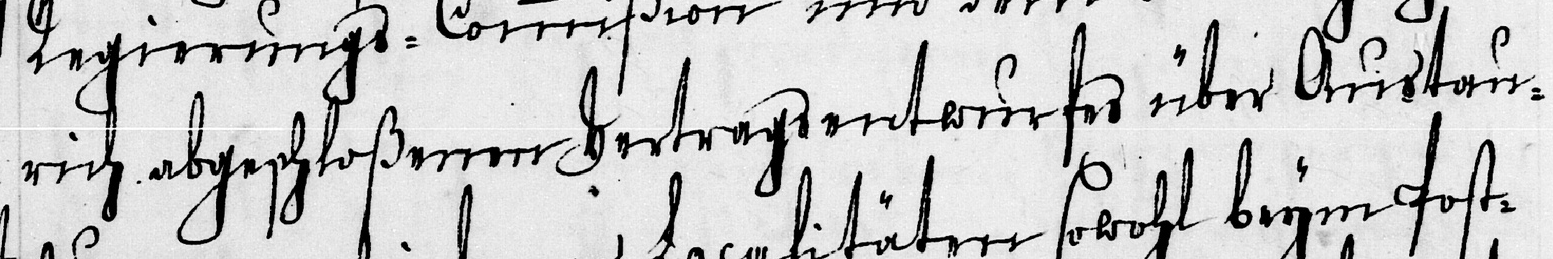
rich abgeschloßenen Vertragsentwurfes über Austaus¬
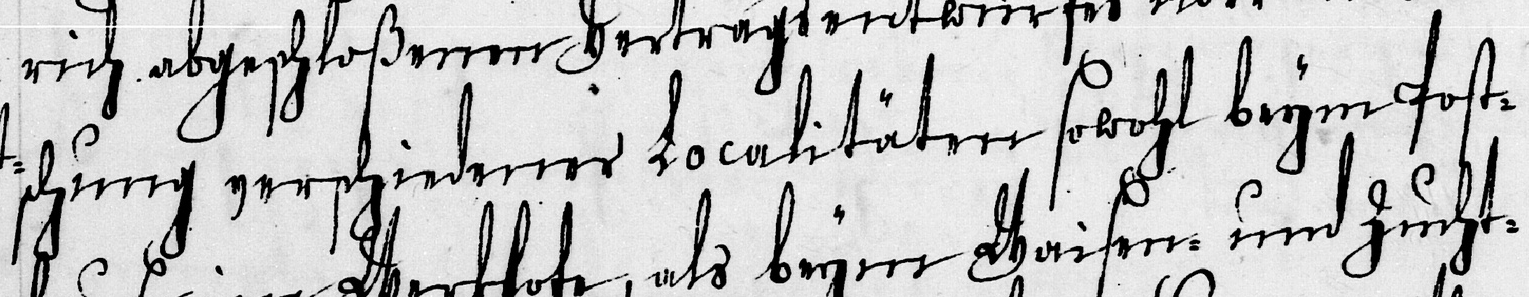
chung verschiedener Localitäten sowohl beym Post¬
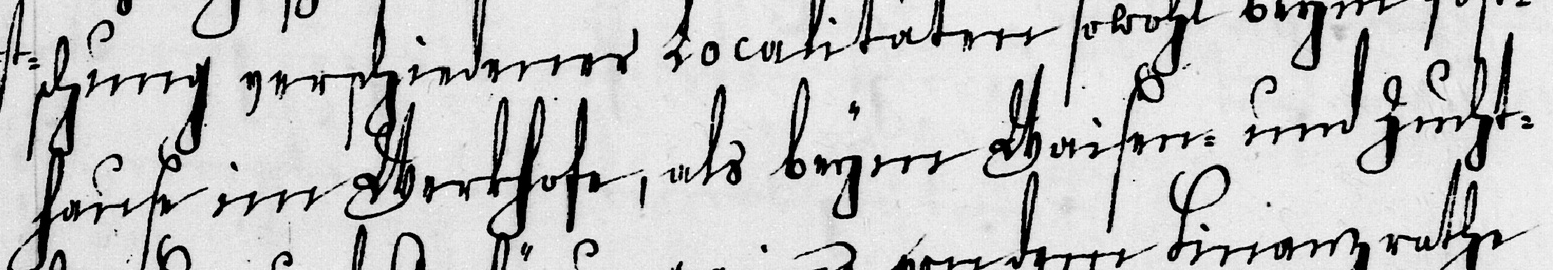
hause im Werkhof, als beym Waisen- und Zucht¬
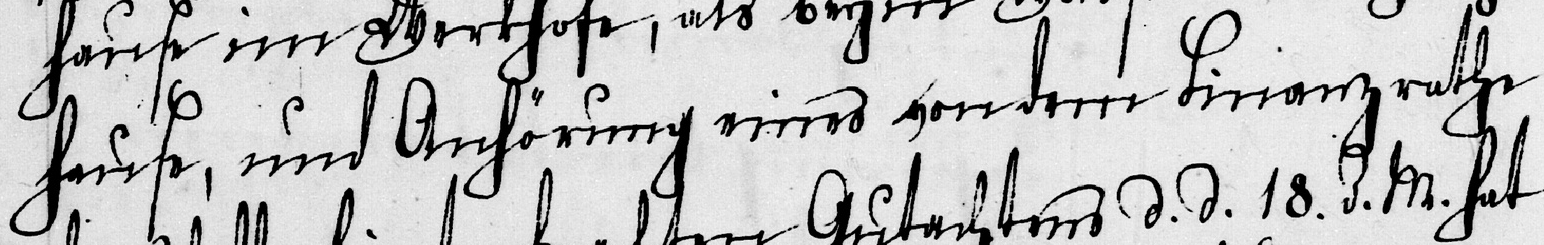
hause, und Anhörung eines von dem Finanzrathe
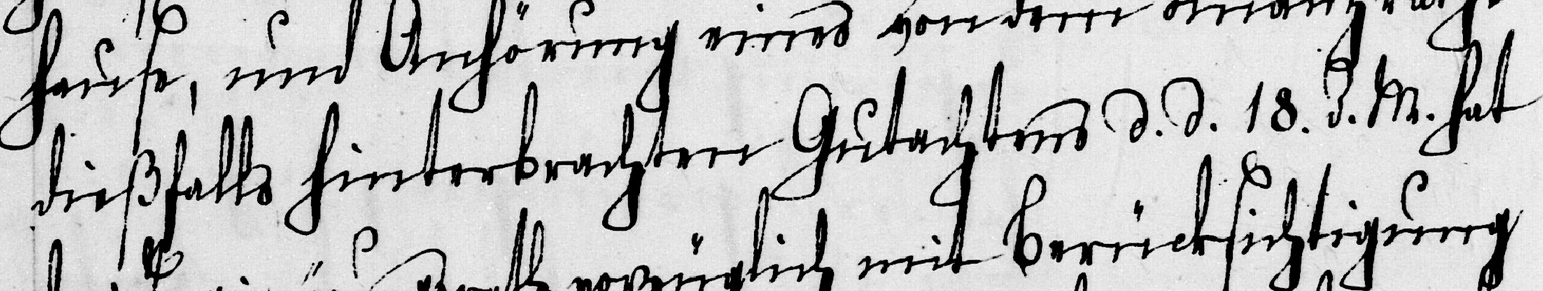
dießfalls hinterbrachten Gutachtens d. d. 18. d. M. hat
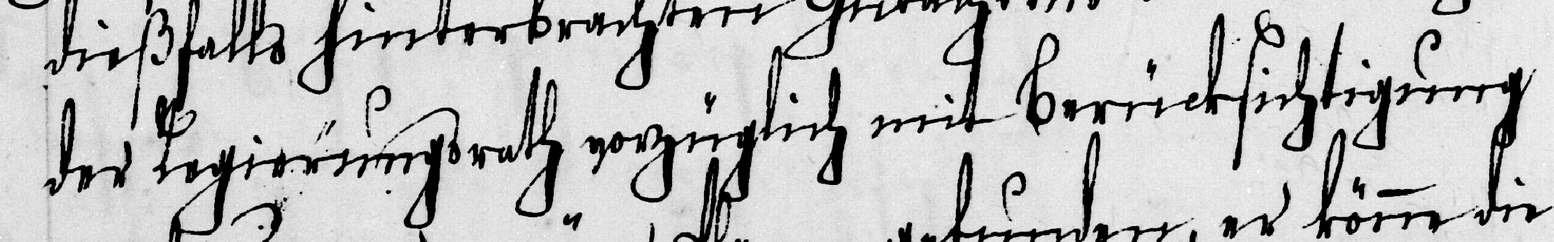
der Regierungsrath vorzüglich mit Berücksichtigung
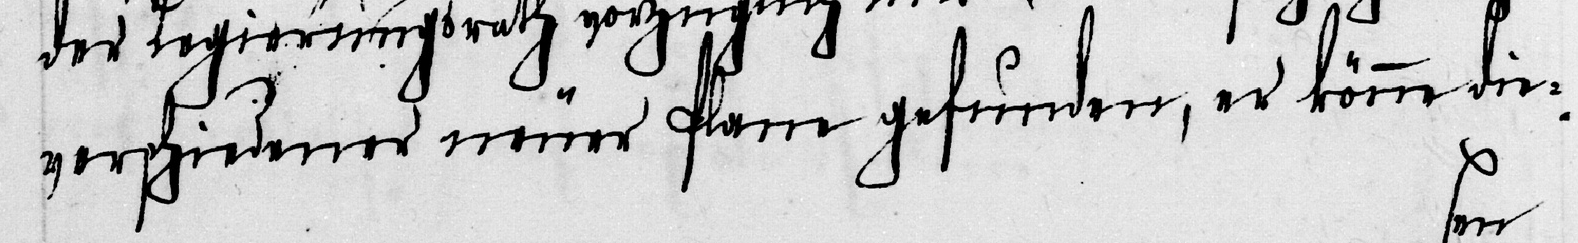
verschiedener neuer Plane gefunden, er könne die-
